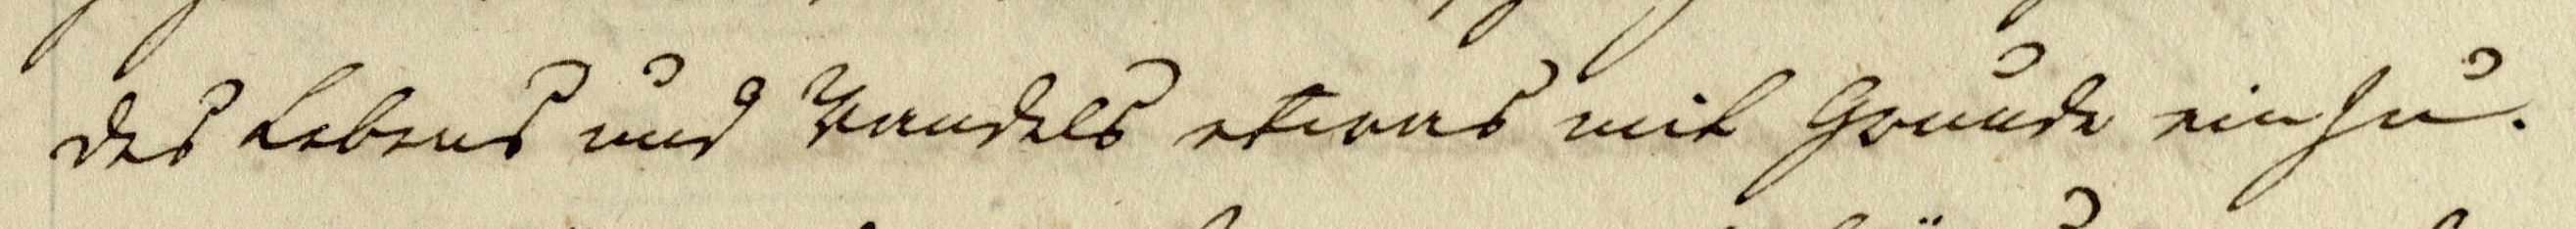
des Lebens und Wandels etwas mit Grunde einzu¬
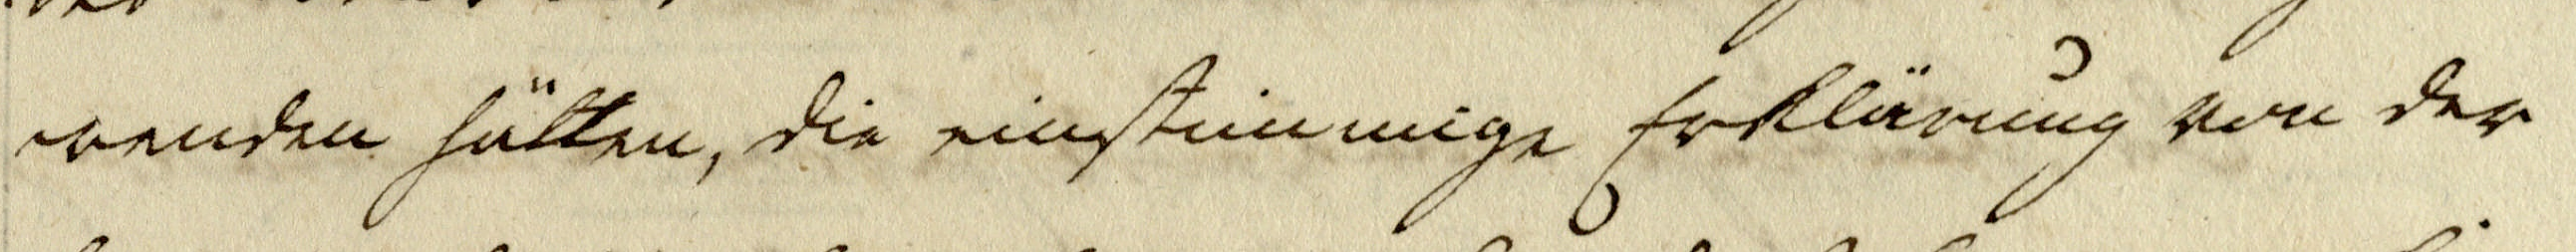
wenden hätten, die einstimmige Erklärung von der
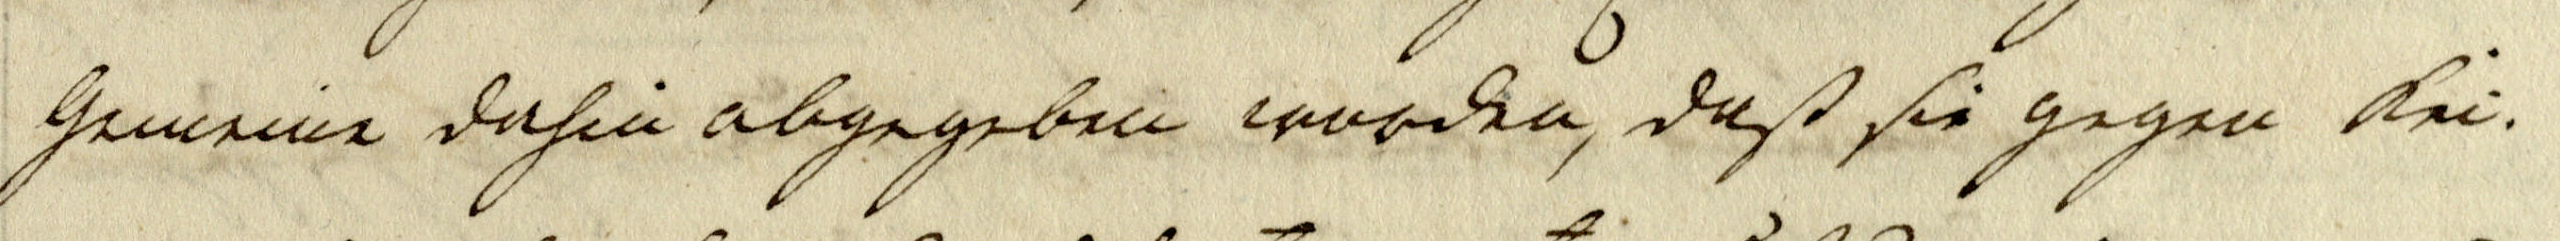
Gemeine dahin abgegeben worden, daß sie gegen kei¬
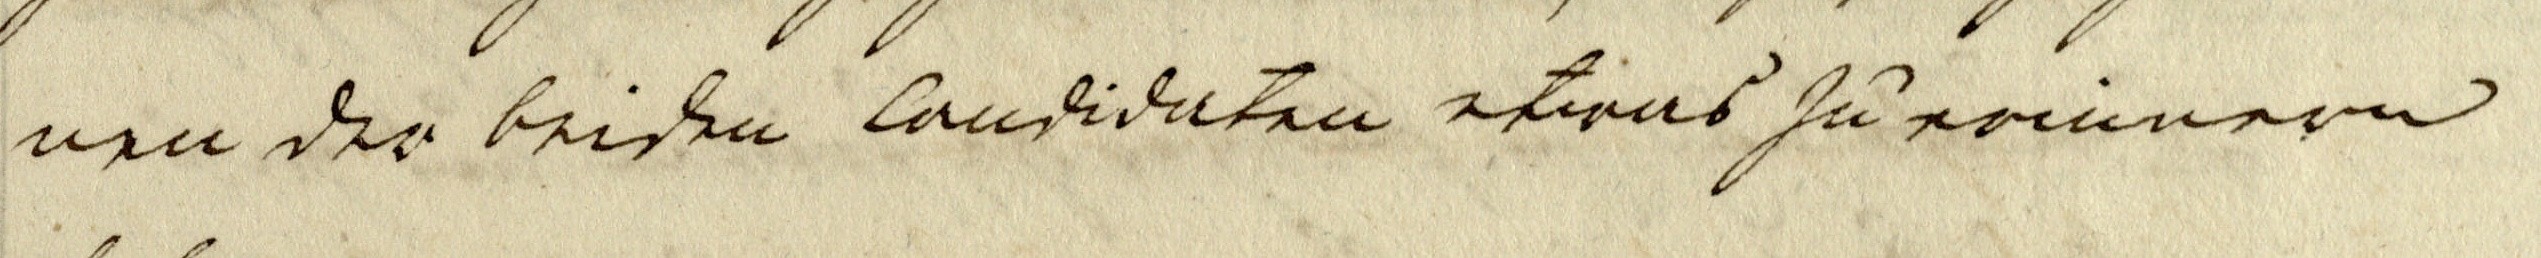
nen der beiden Candidaten etwas zu erinnern
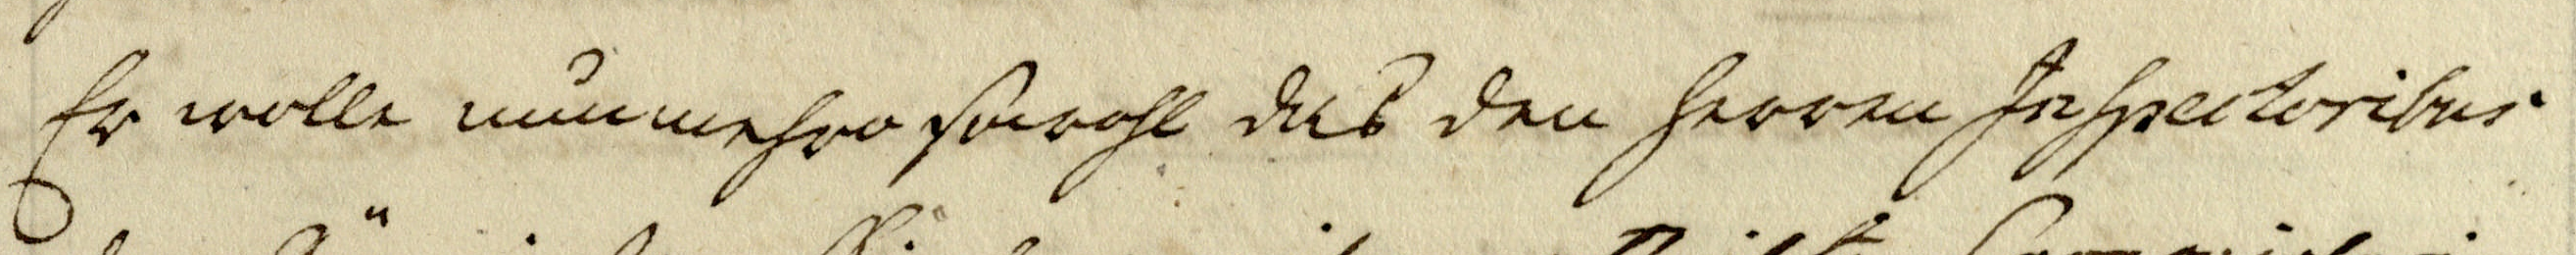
Er wolle nunmehro sowohl das den Herren Inspectoribus
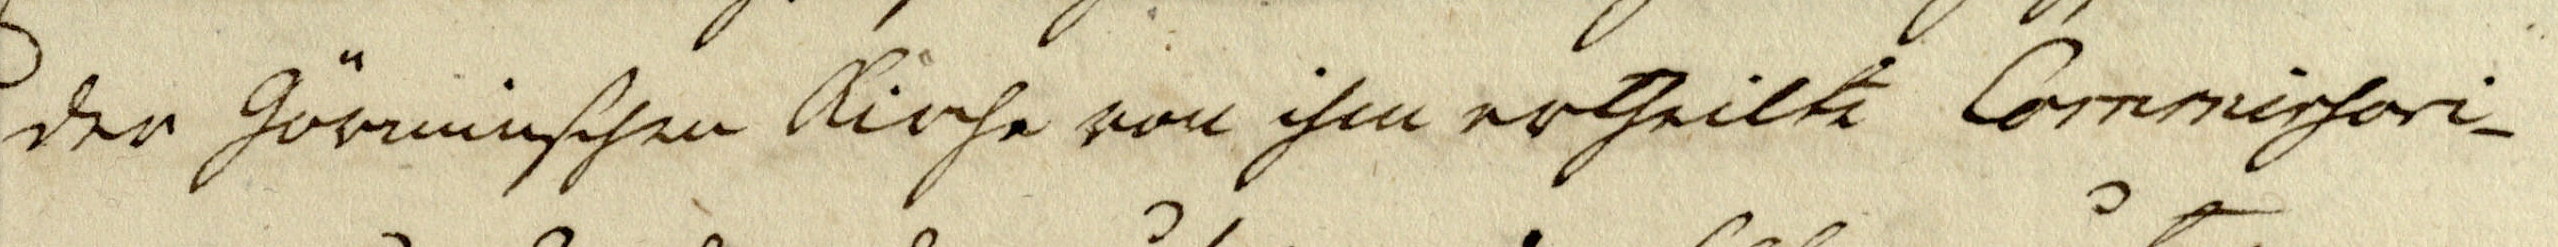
der Görminschen Kirche von ihm ertheilte Commissori¬
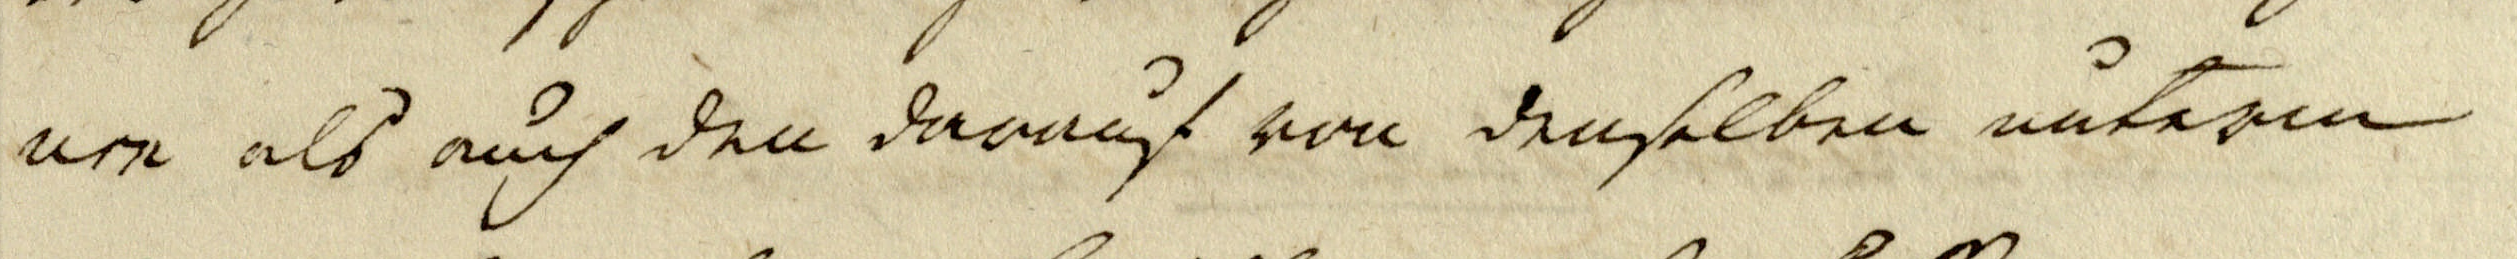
um als auch den darauf von denselben unterm
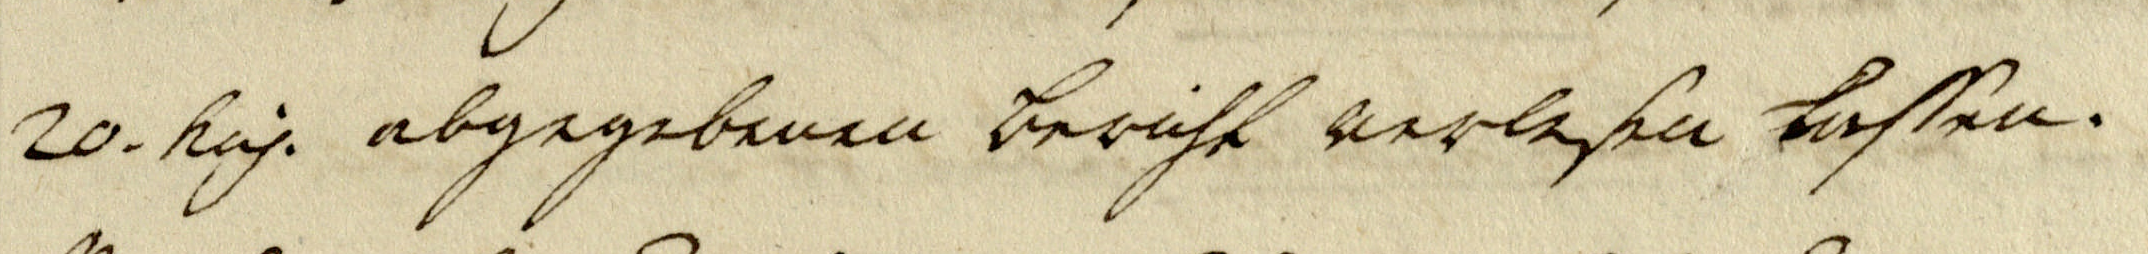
20. huj. abgegebenen Bericht verlesen lassen.
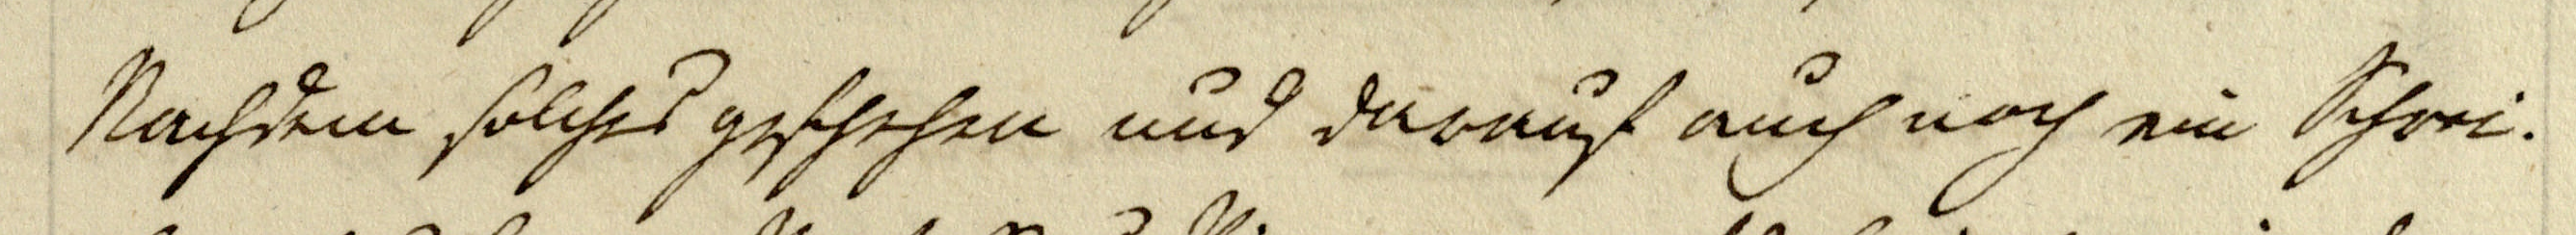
Nachdem solches geschehen und darauf auch noch ein Schrei¬
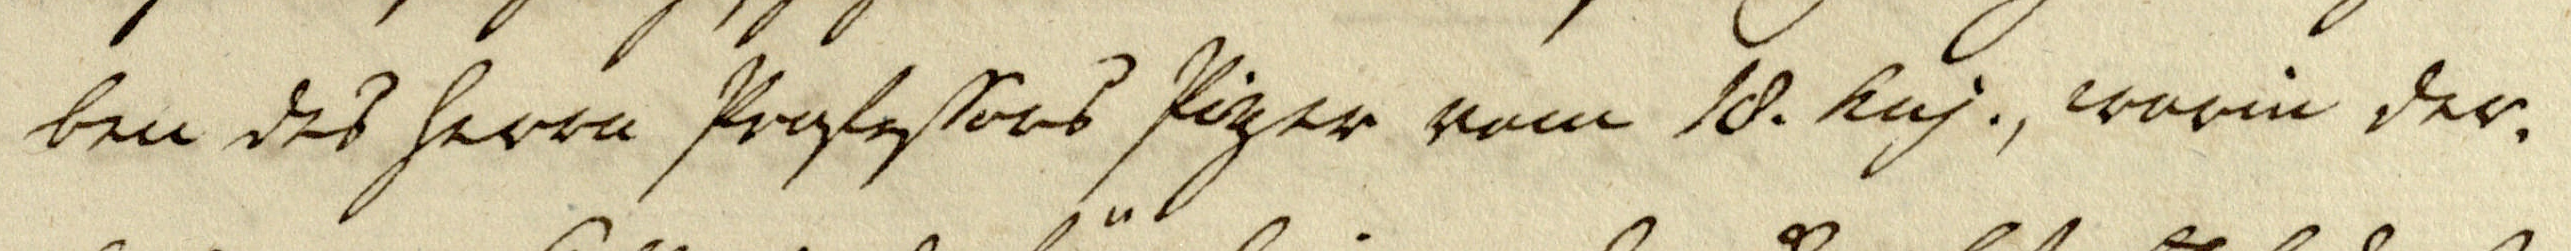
ben des Herrn Professors Piper vom 18. huj., worin der¬
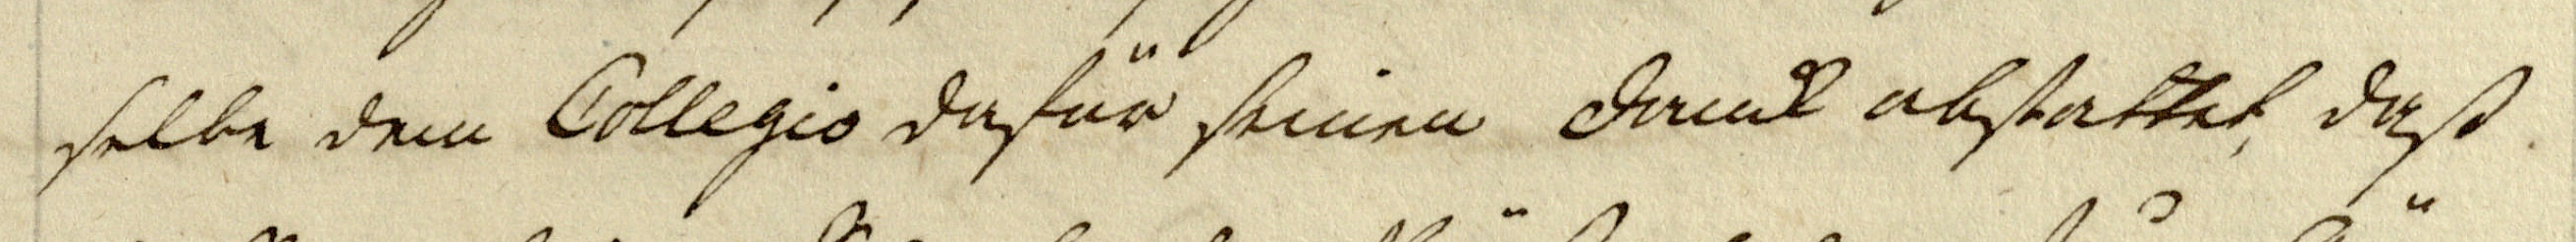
selbe dem Collegio dafür seinen Dank abstattet, daß
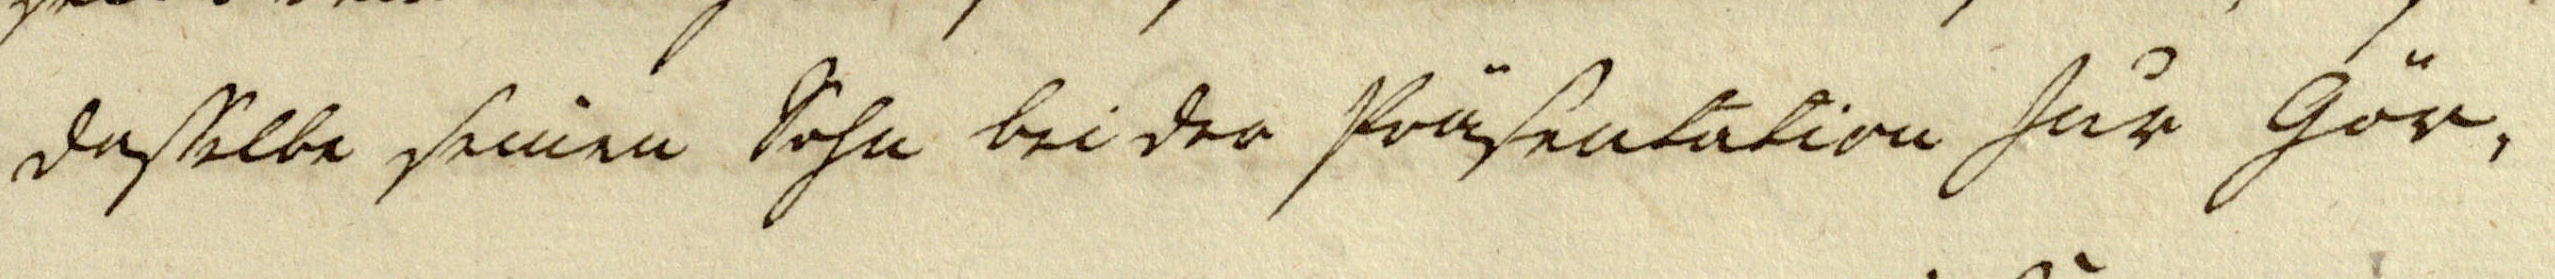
dasselbe seinen Sohn bei der Präsentation zur Gör¬
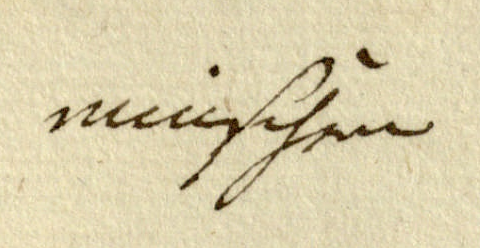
minschen
